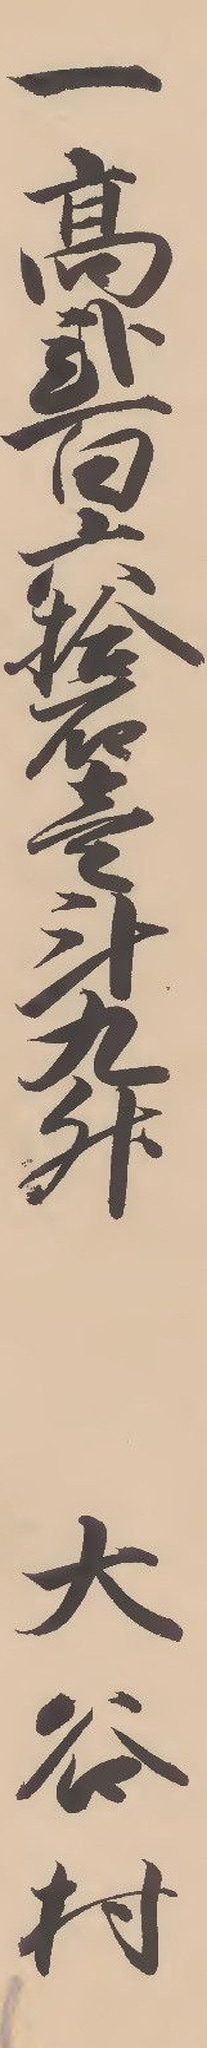一高弐百六拾石壱斗九升大谷村
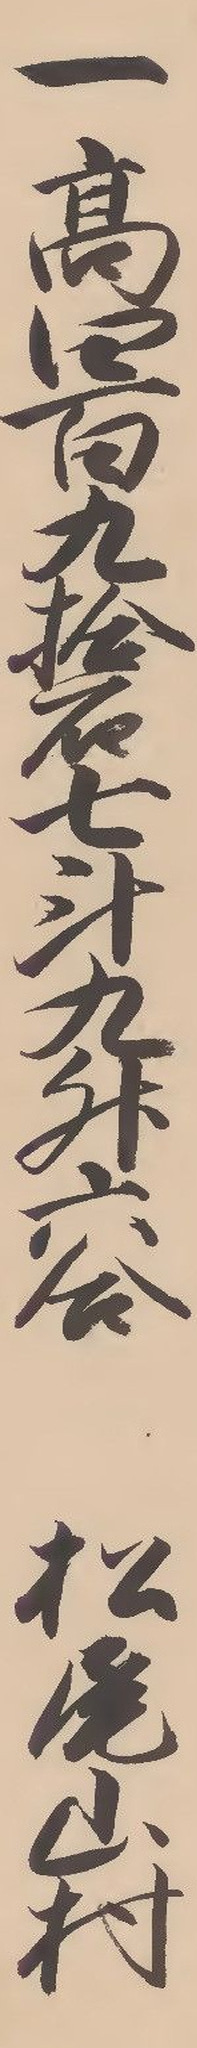一高四百九拾石七斗九升六合松尾山村

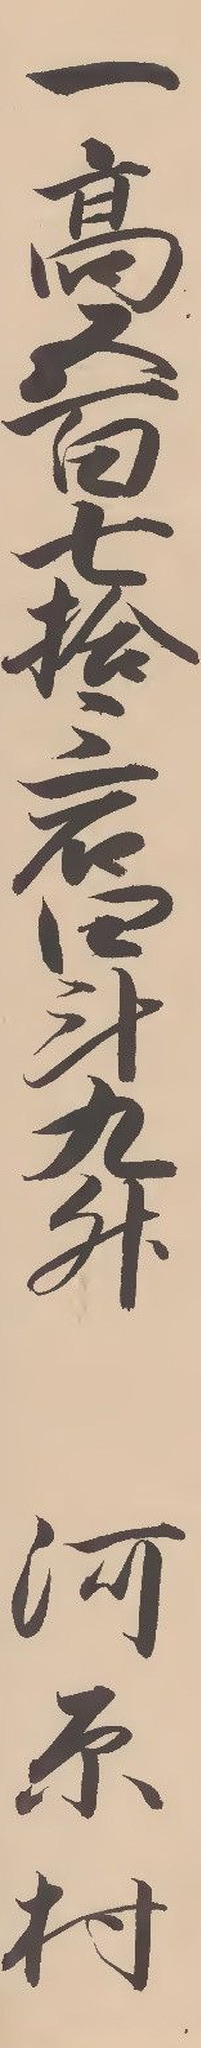一高五百七拾三石四斗九升河原村
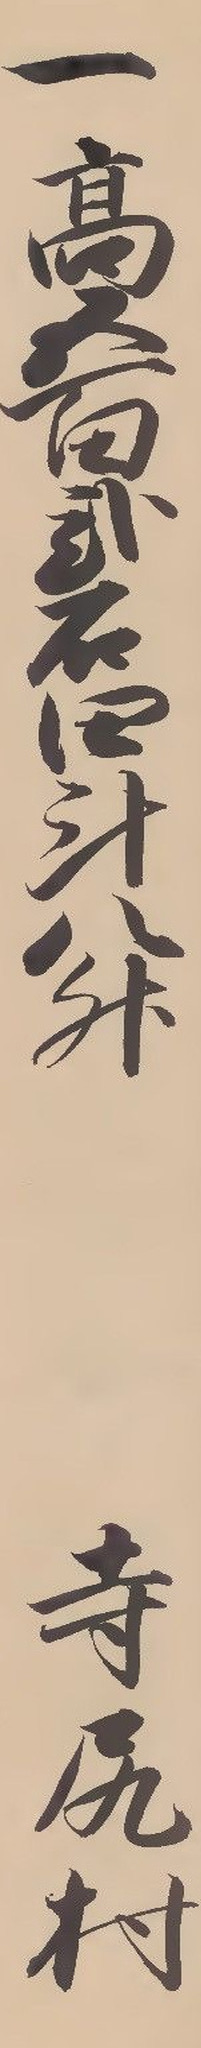一高五百弐石四斗八升寺尻村
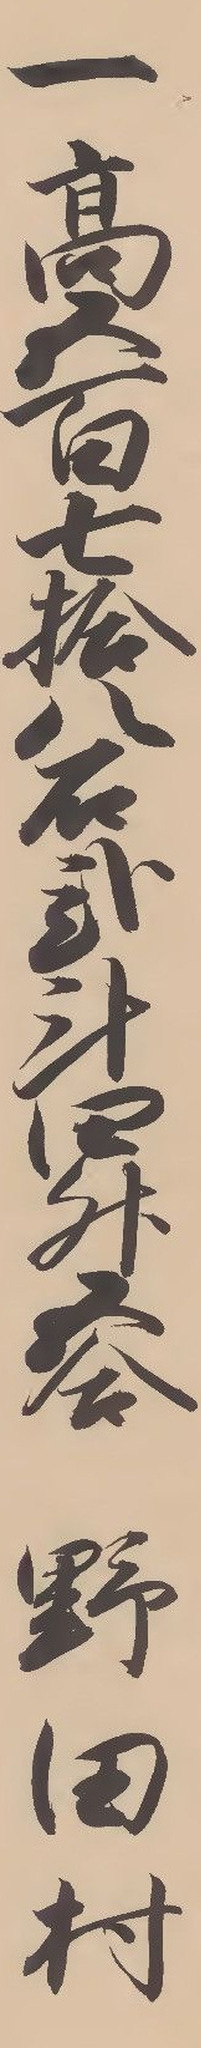一高五百七拾八石弐斗四升五合野田村
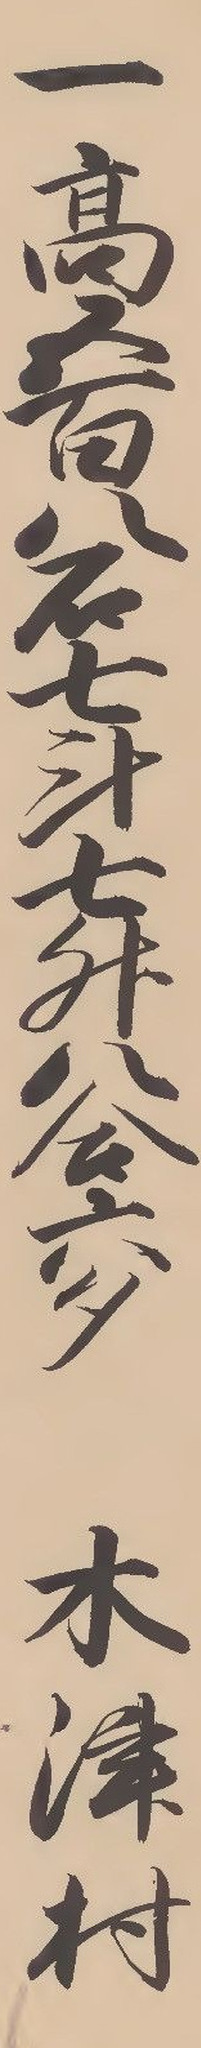一高五百八石七斗七升八合六勺木津村
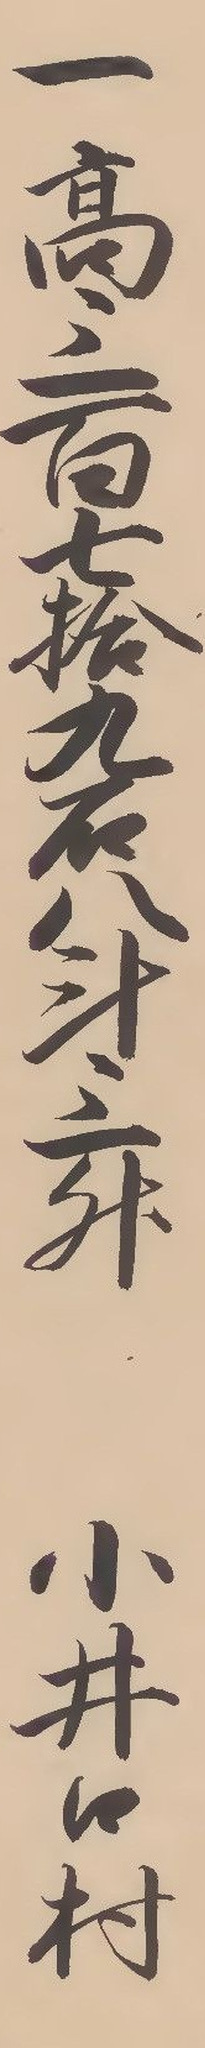一高三百七拾九石八斗三升小井口村

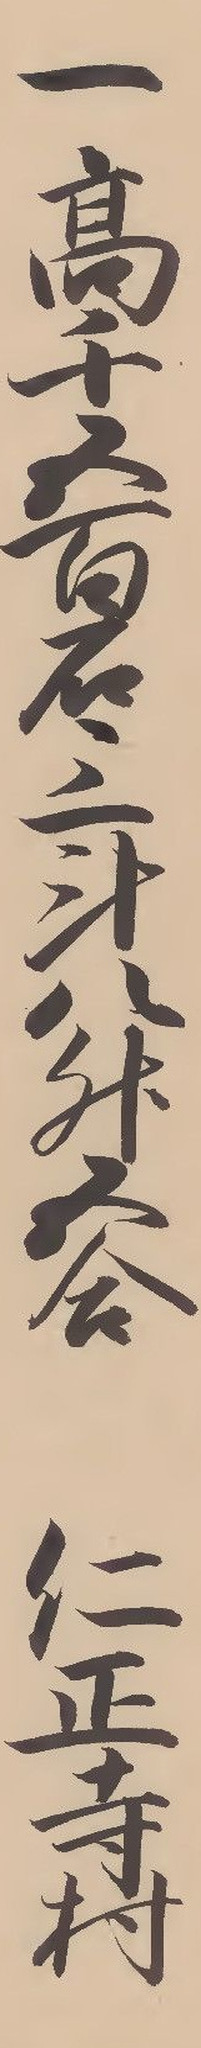一高千五百石三斗八升五合仁正寺村
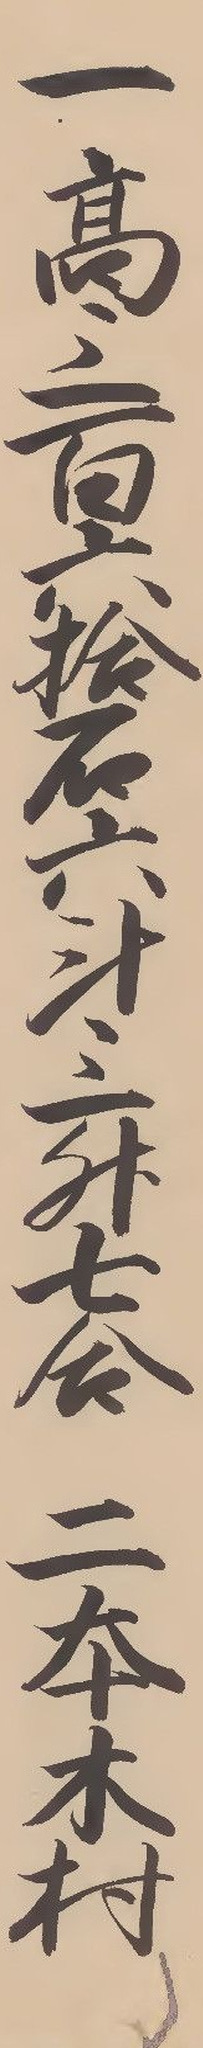一高三百六拾石六斗三升七合二本木村
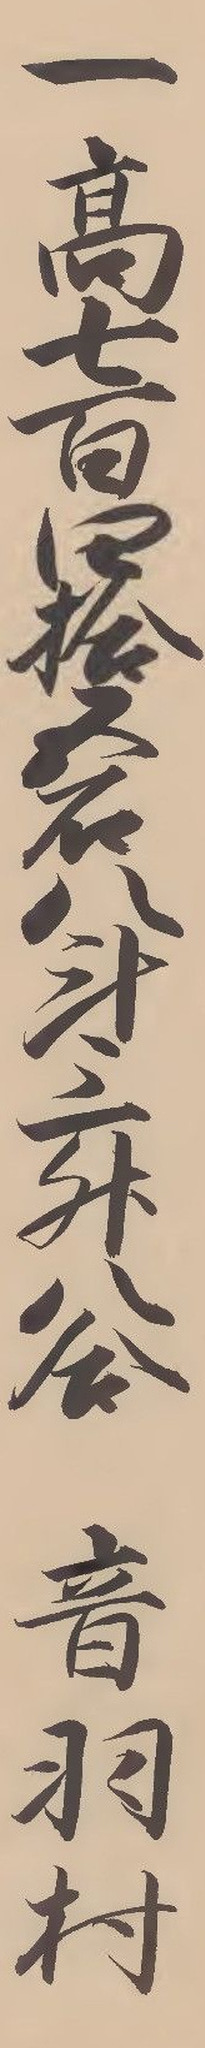一高七百四拾五石八斗三升八合音羽村
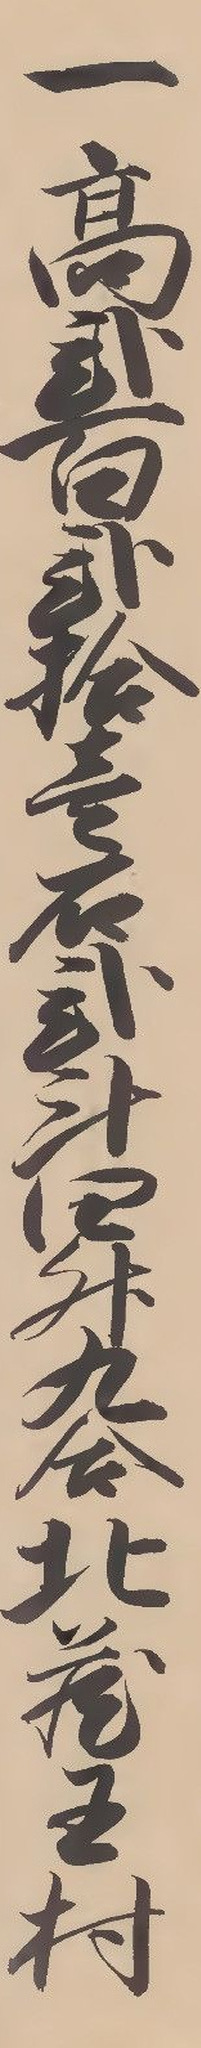一高弐百弐拾壱石弐斗四升九合北蔵王村
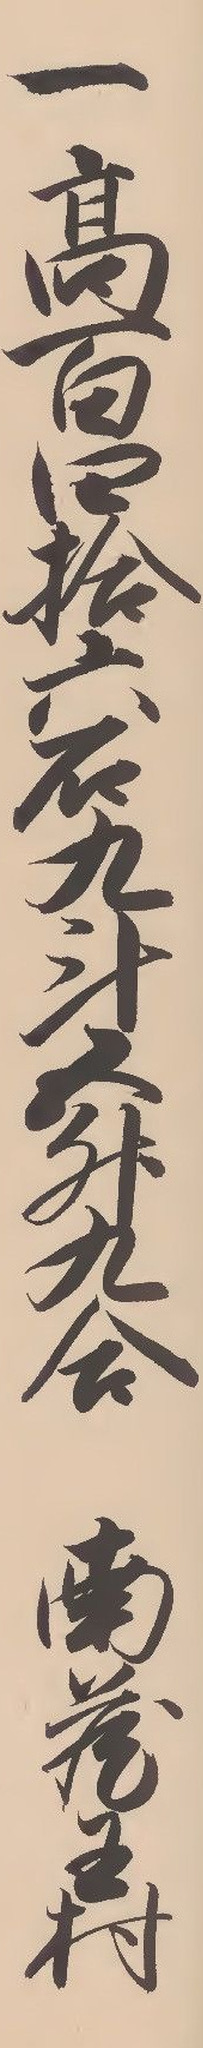一高百四拾六石九斗五升九合南蔵王村
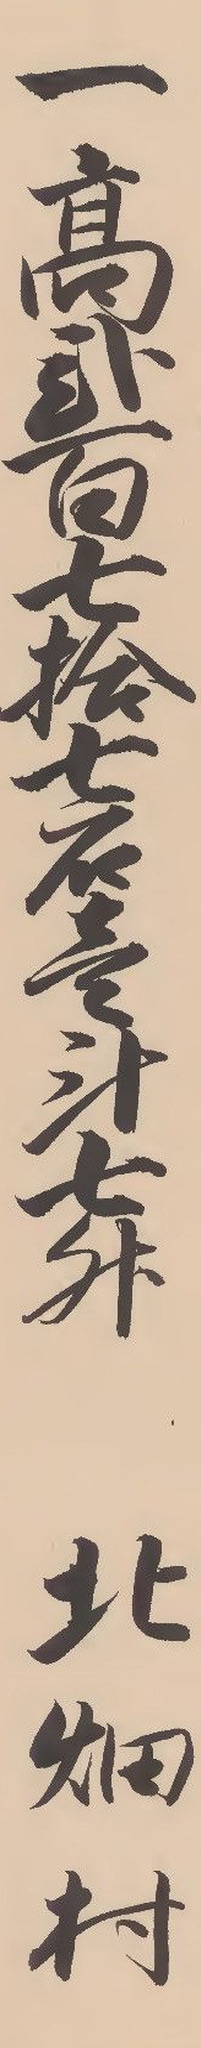一高弐百七拾七石壱斗七升北畑村
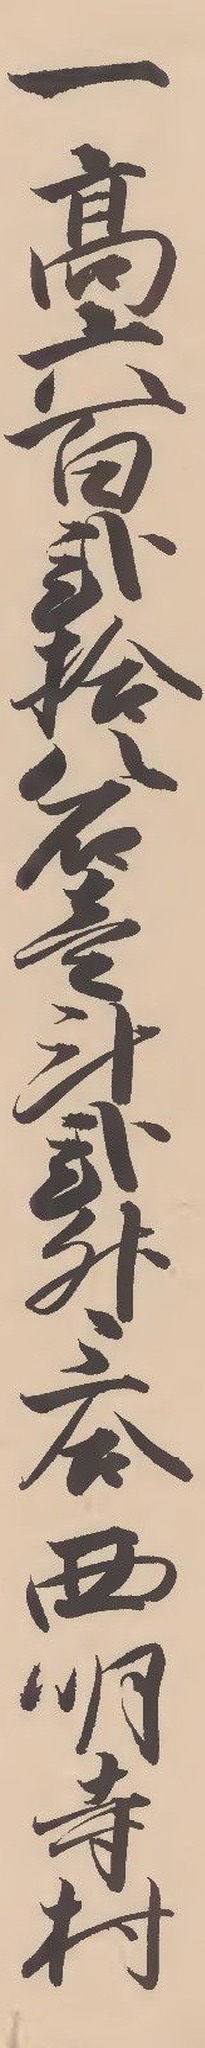一高六百弐拾八石壱斗弐升三合西明寺村
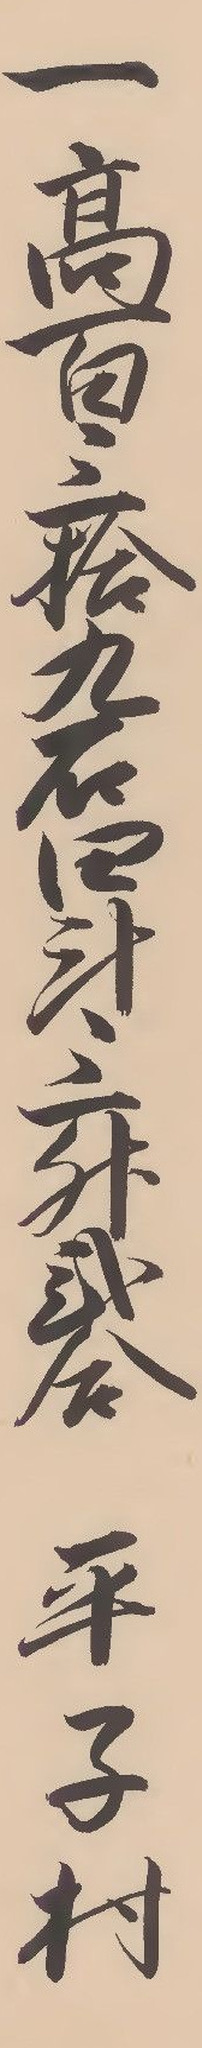一高百三拾九石四斗三升弐合平子村

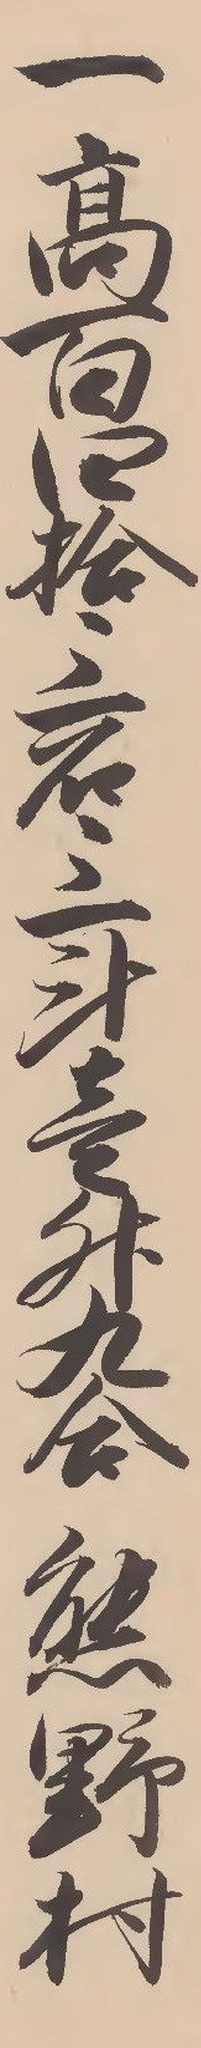一高百四拾三石三斗壱升九合熊野村
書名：近江国郷帳
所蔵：国立公文書館 National Archives of Japan
